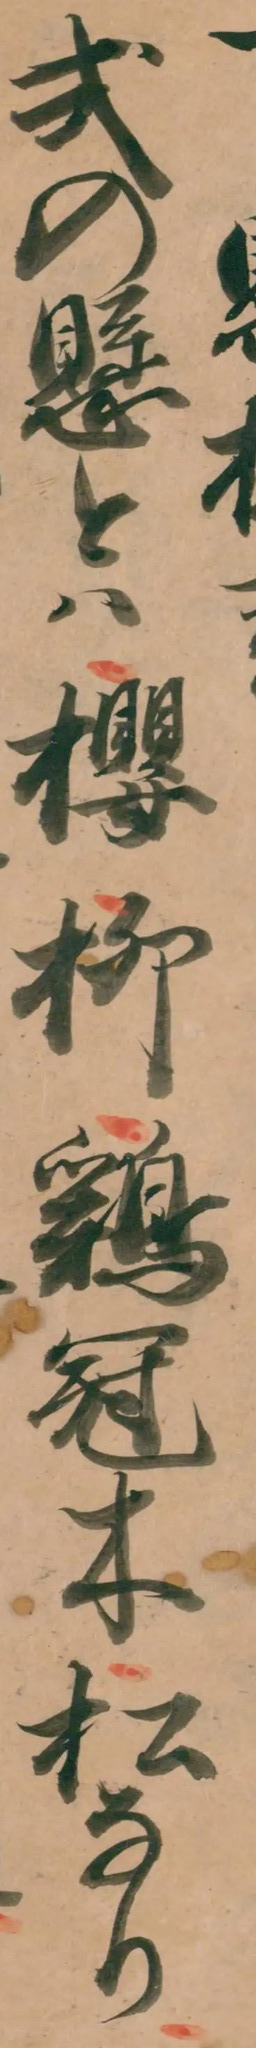式の懸とハ桜柳鶏冠木松なり
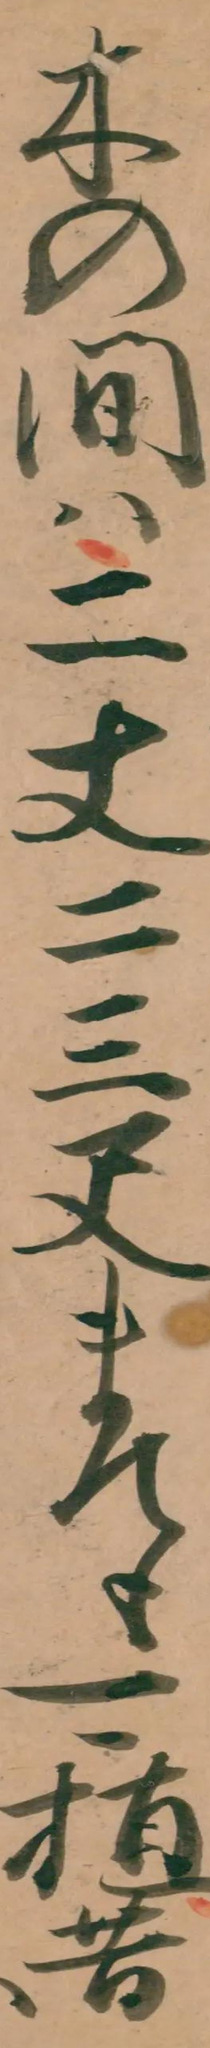木の間ハ二丈二三尺まても可植昔ハ
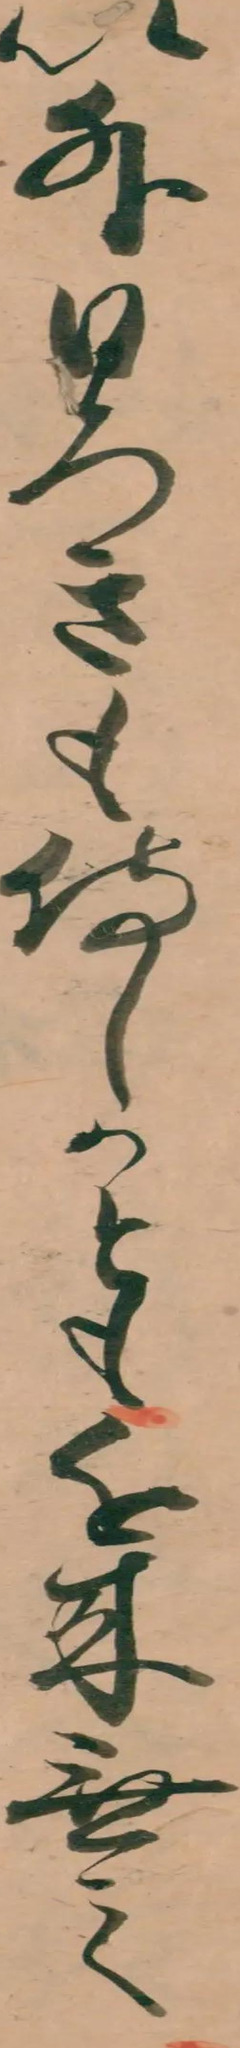以外ひろきも侍しかとも近来無之
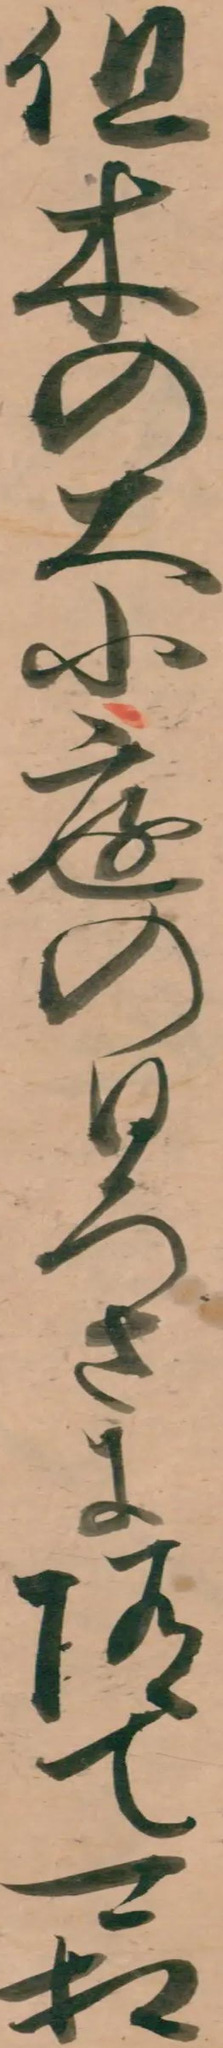但木の大小庭のひろさに随て可相
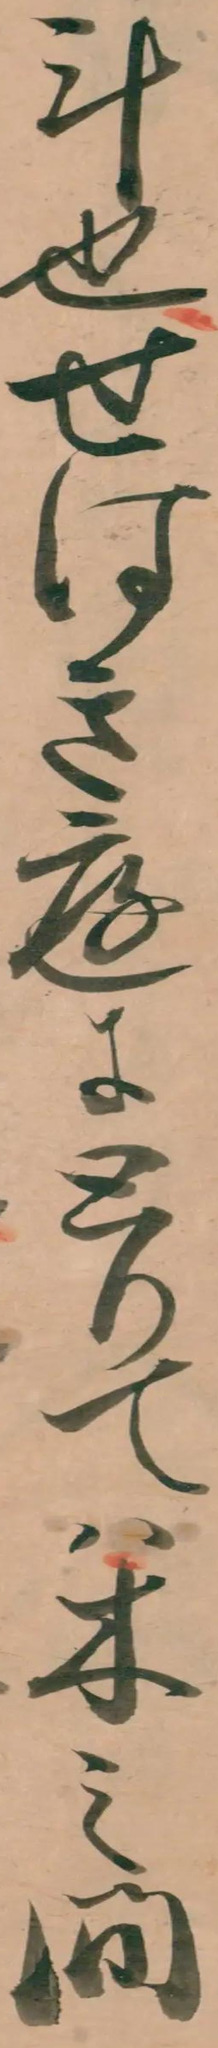計也せはき庭にとりてハ木之間
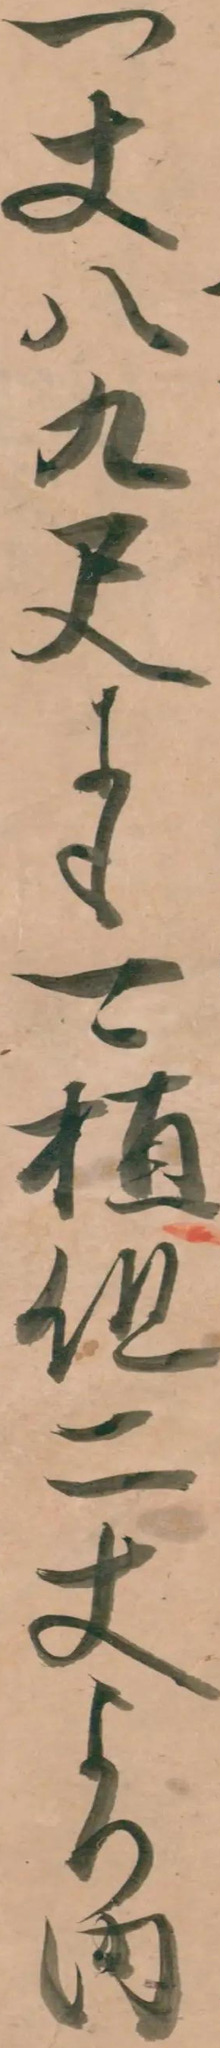一丈八九尺にも可植但二丈より内
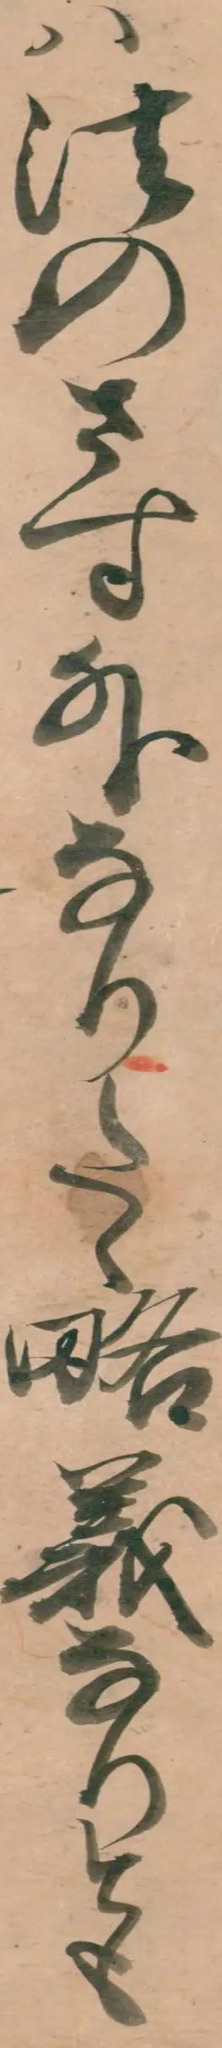ハ法のさす外なりたゝ略義なりとも
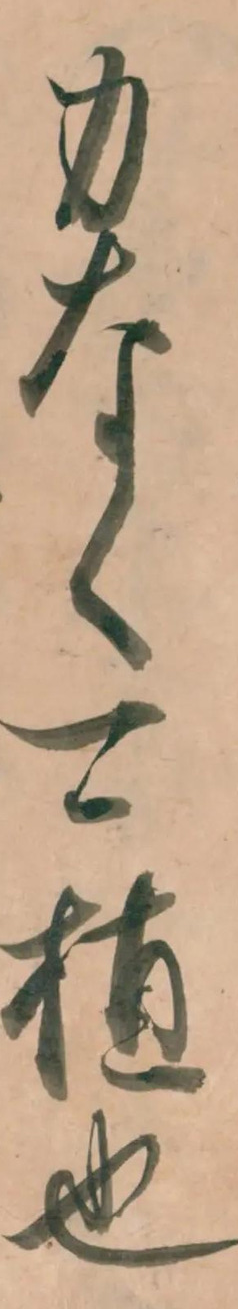力なく可植也
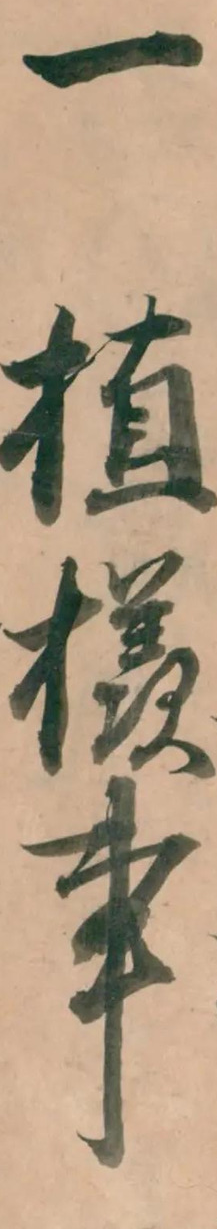一植様事
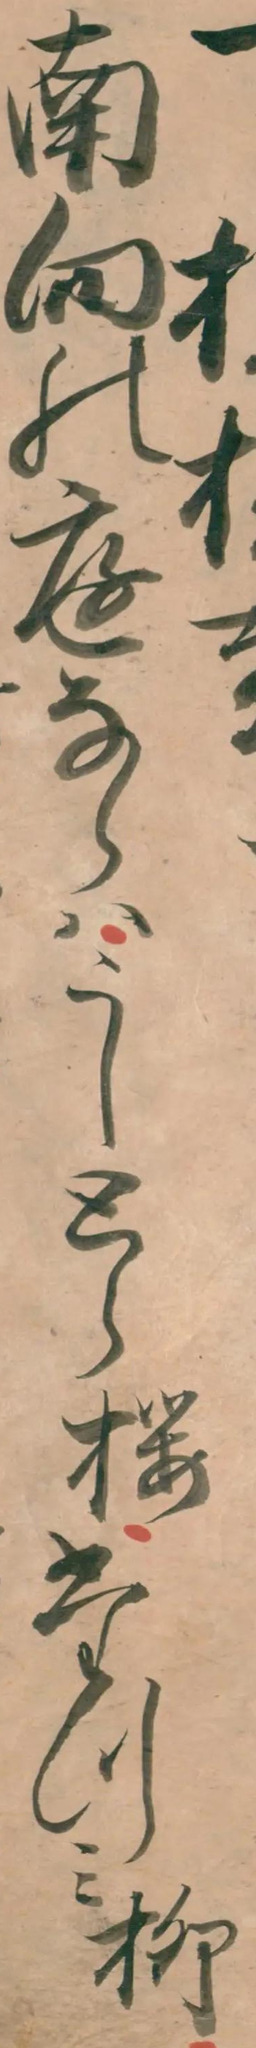南向の庭ならハうしとら桜たつミ柳
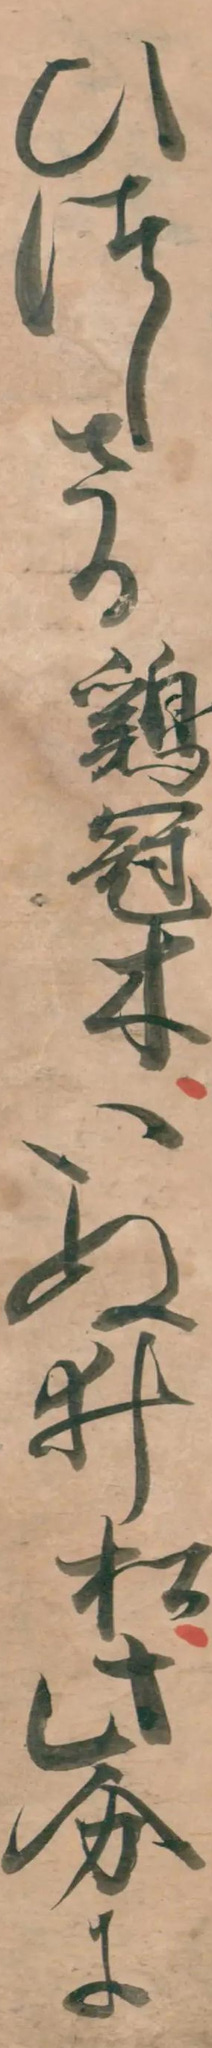ひつしさる鶏冠木いぬヰ松此分に

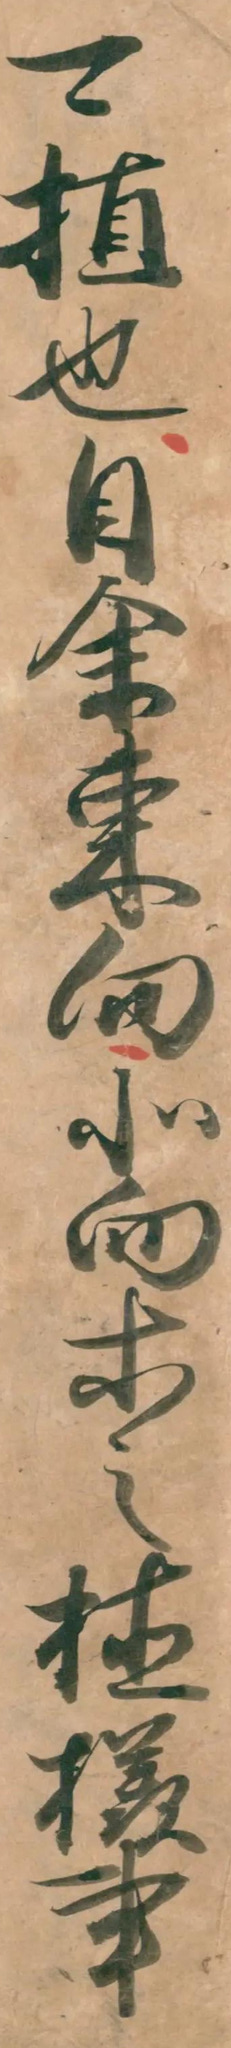可植也自余東向北向等之植様事
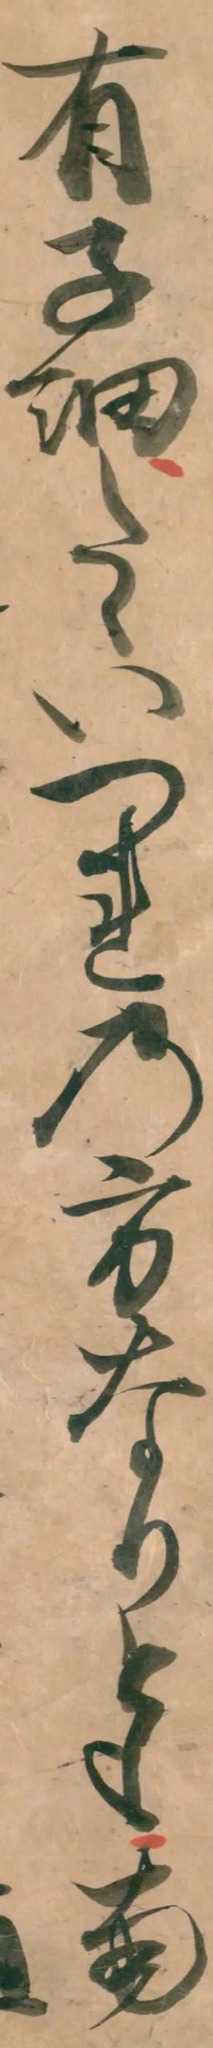有子細たゝいつれの方なりとも南
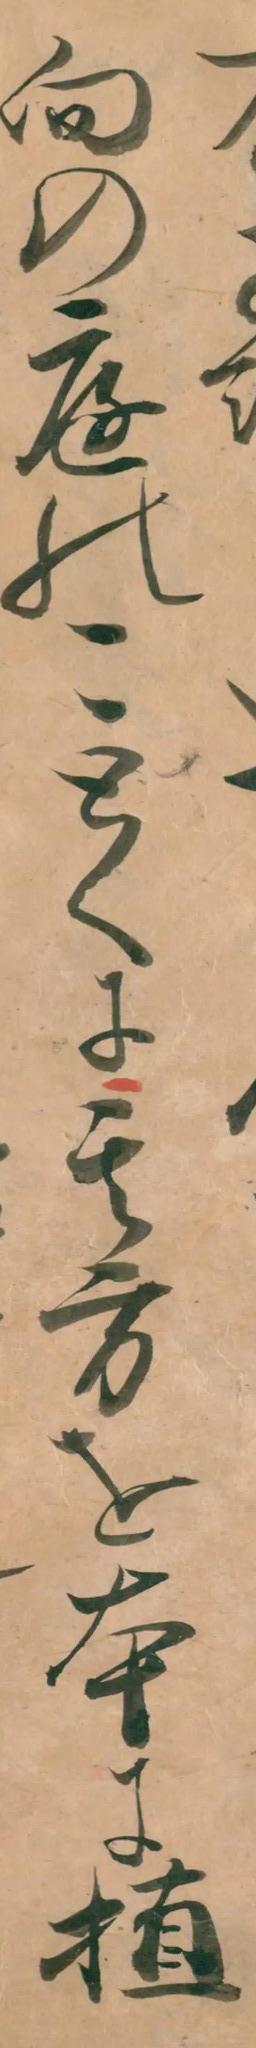向の庭のことくに其方を本に植
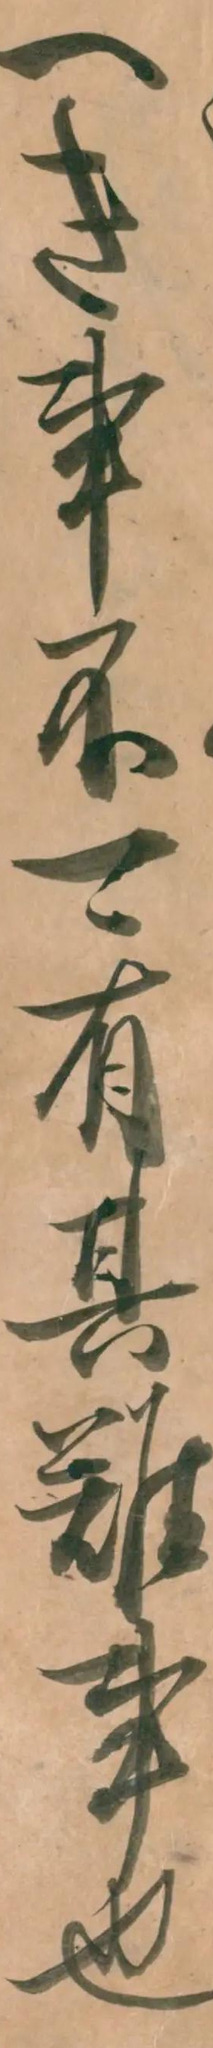へき事不可有其難事也
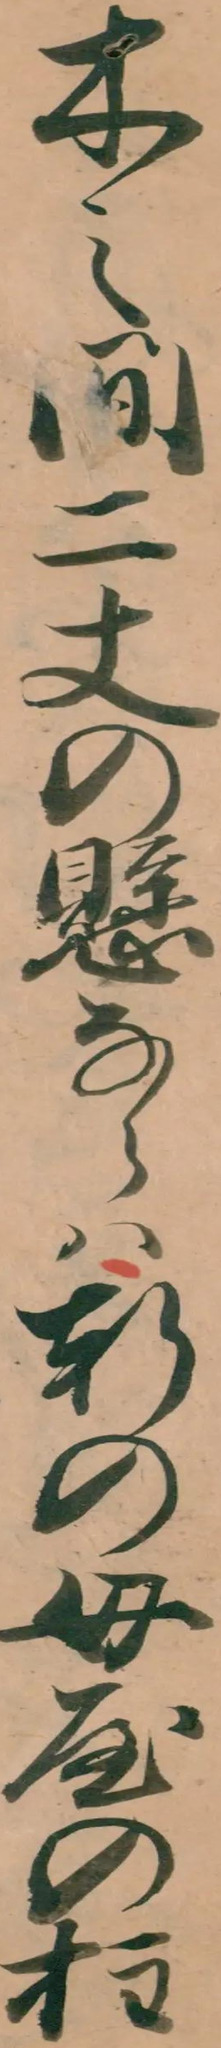木之間二丈の懸ならハ軒の母屋の柱
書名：蹴鞠之条々大概
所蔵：国立国会図書館 National Diet Library, JAPAN
